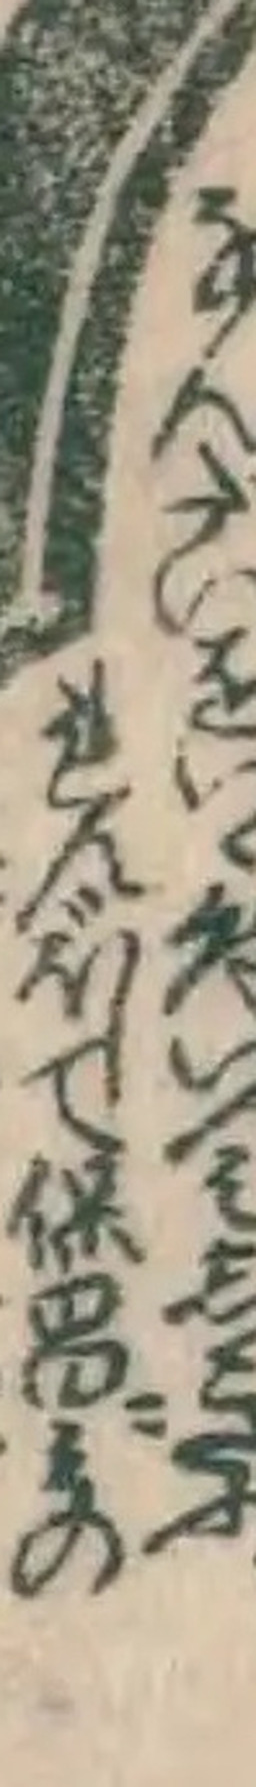れんぼして保昌にみの
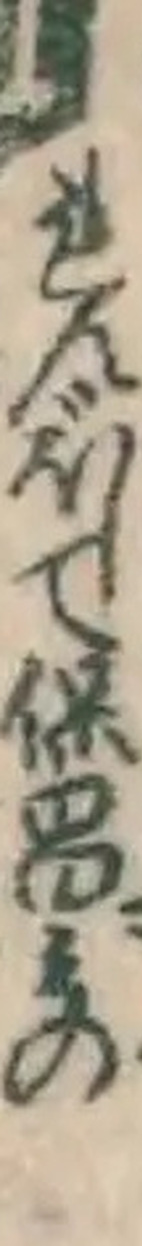れんぼして保昌にみの
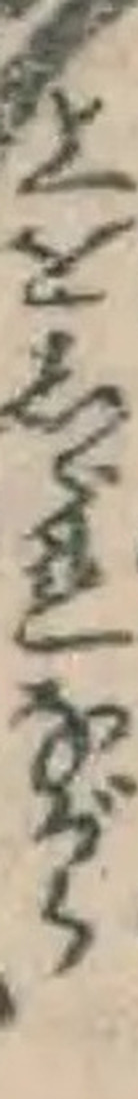上をしられながら
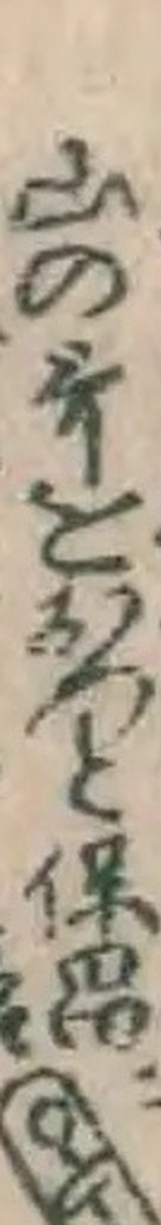山の歌をおつと保昌に
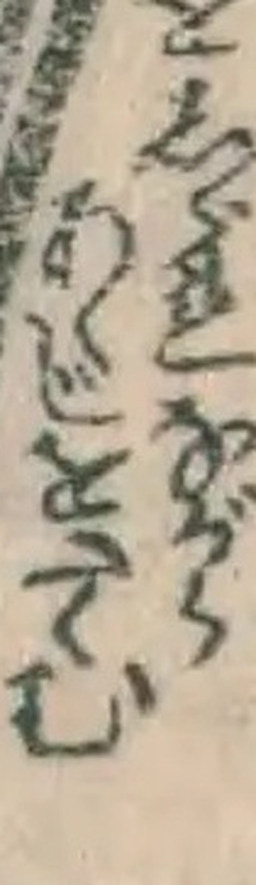あくじをたくむ
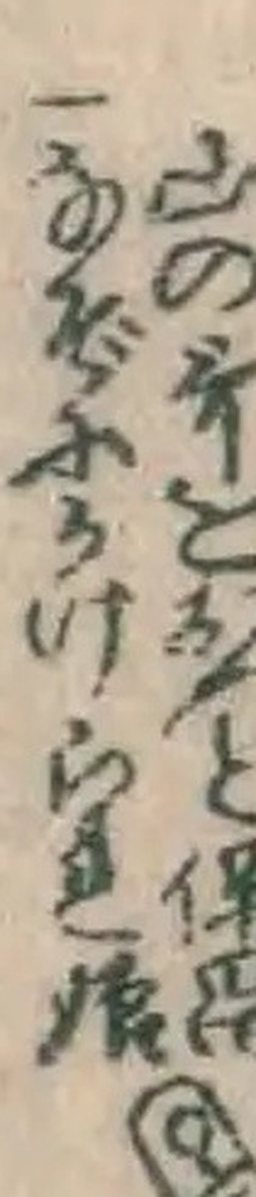一なぞにかけられ娘
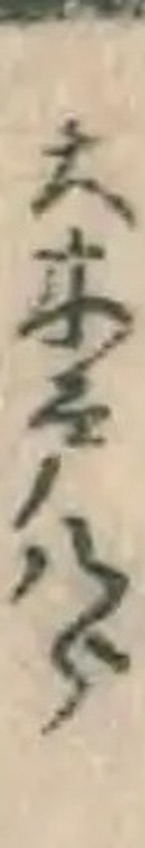大木戸八郎

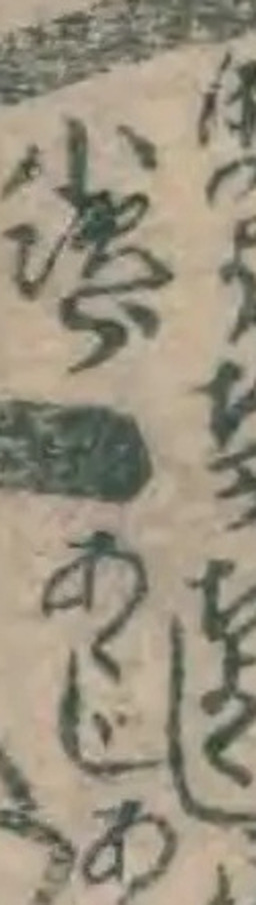小次郎
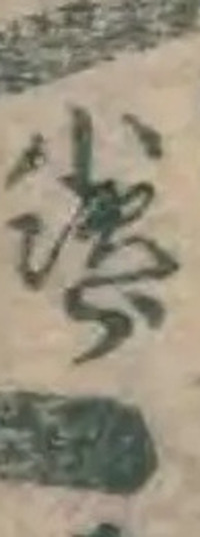小次郎
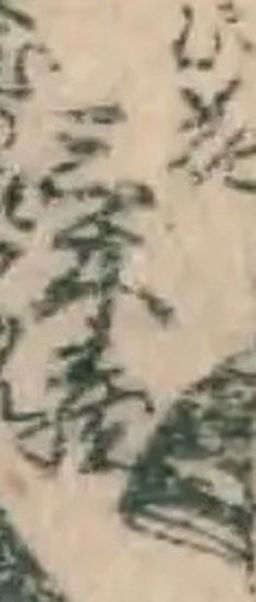三木蔵
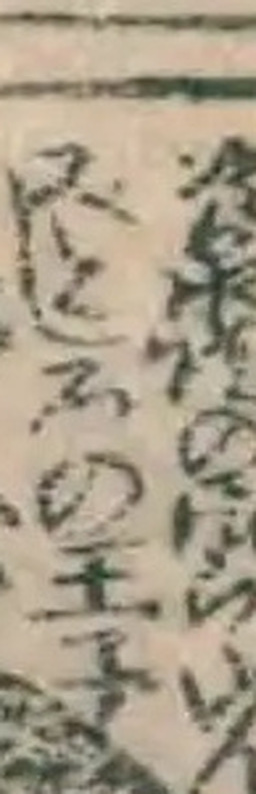みとしろの王子
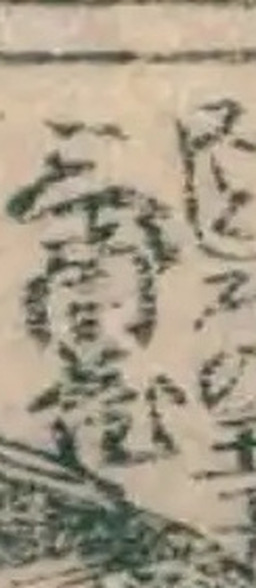三木蔵
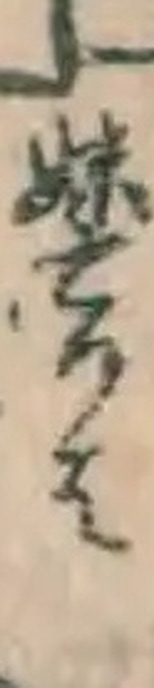妹てりは
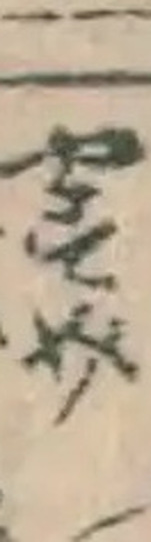やす介
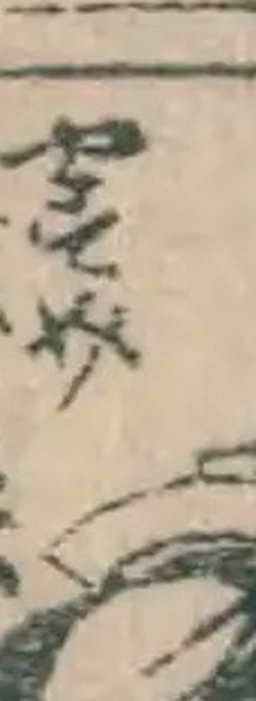やす介
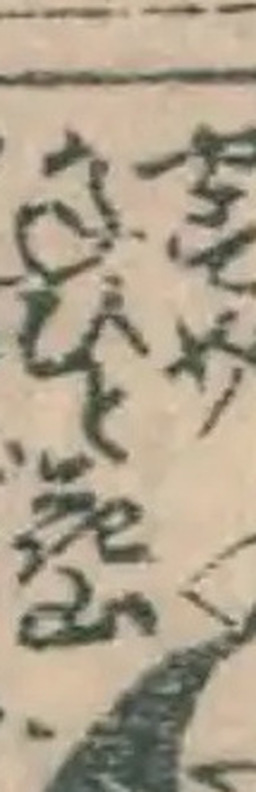かねひと花山
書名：四天王宿直着綿
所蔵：国立国会図書館 National Diet Library, JAPAN
